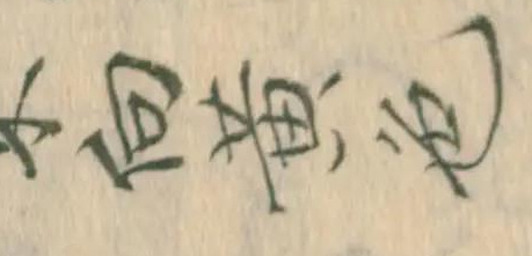東向黄色
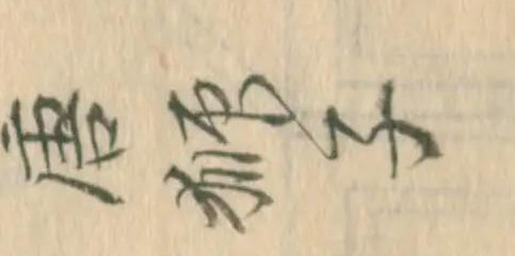唐獅子
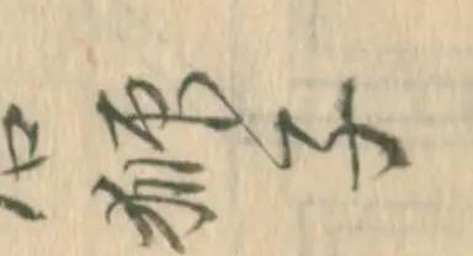唐獅子
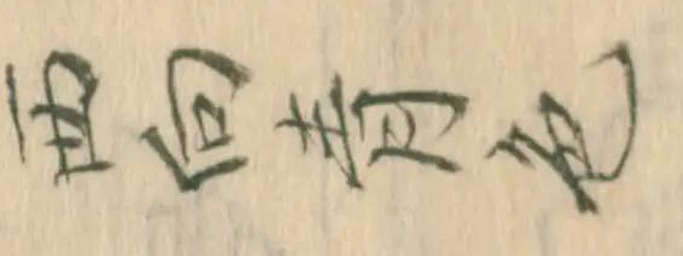西向青色
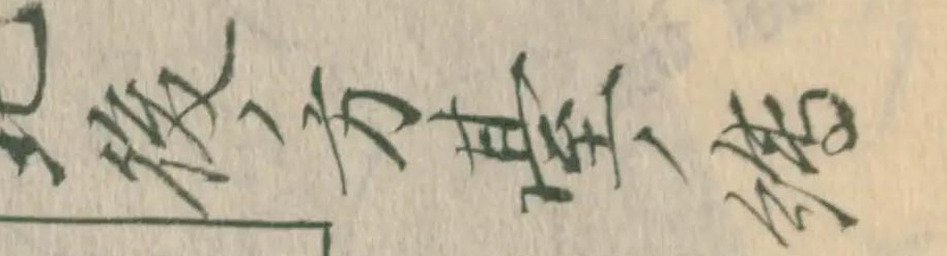北後ノ方台ノ絵

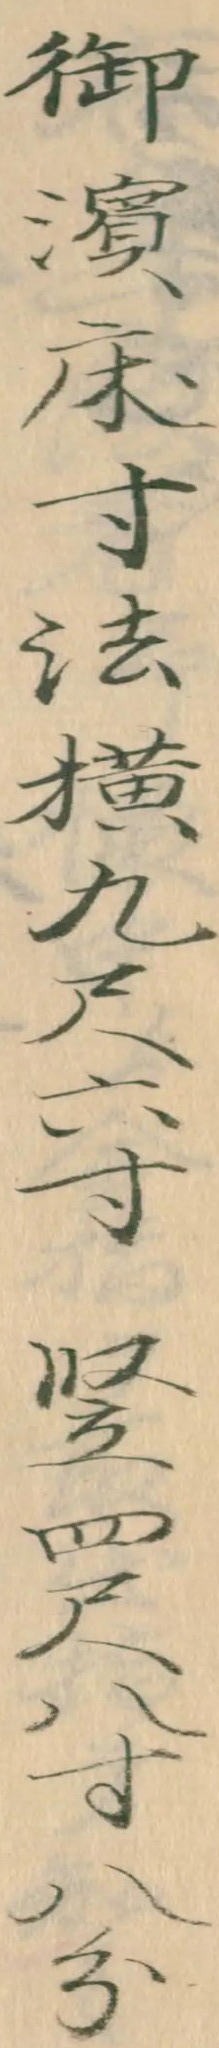御浜床寸法横九尺六寸竪四尺八寸八分
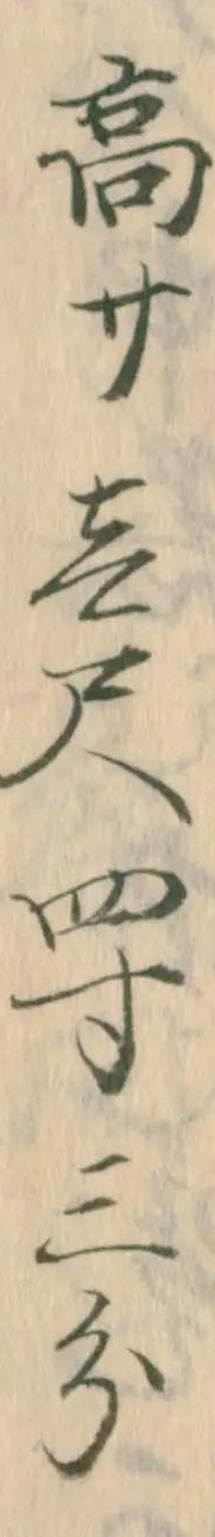高サ壱尺四寸三分
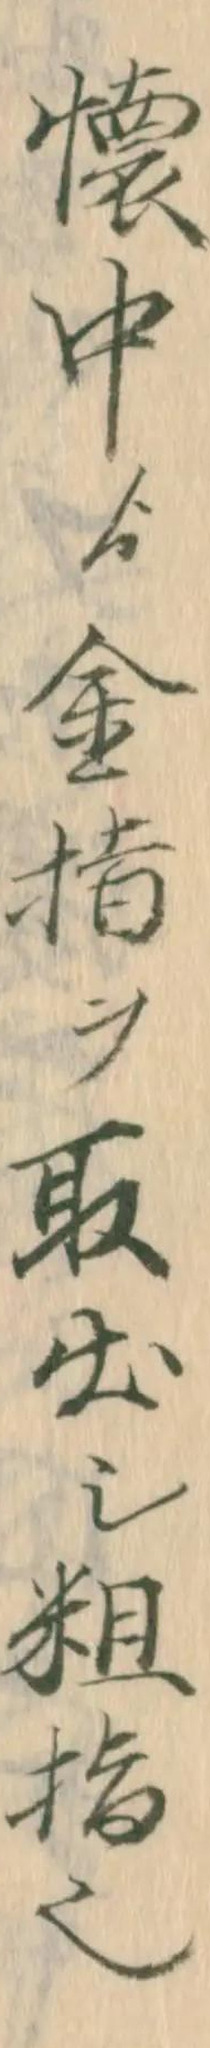懐中ゟ金指ヲ取出シ粗指也

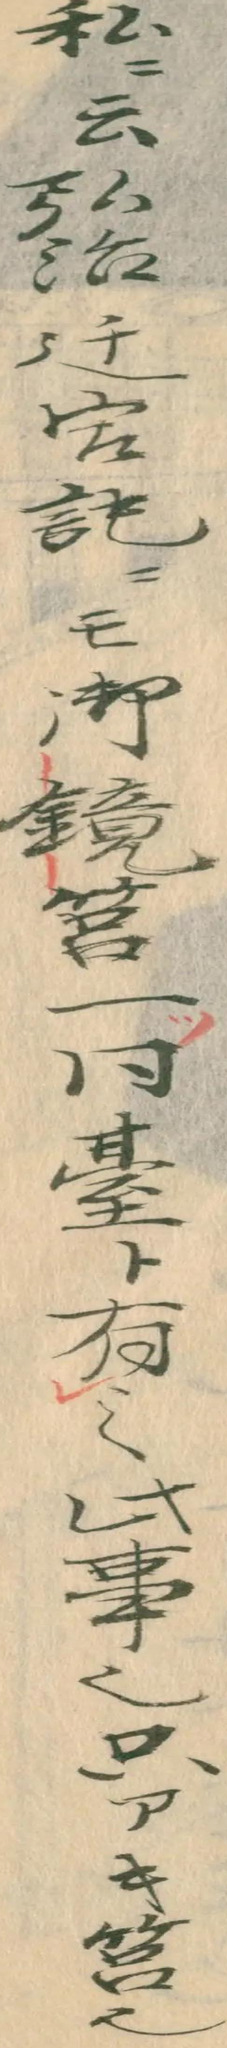私ニ云弘治迁宮記ニモ御_鏡_筥一同台ト有之此事也只アキ筥也
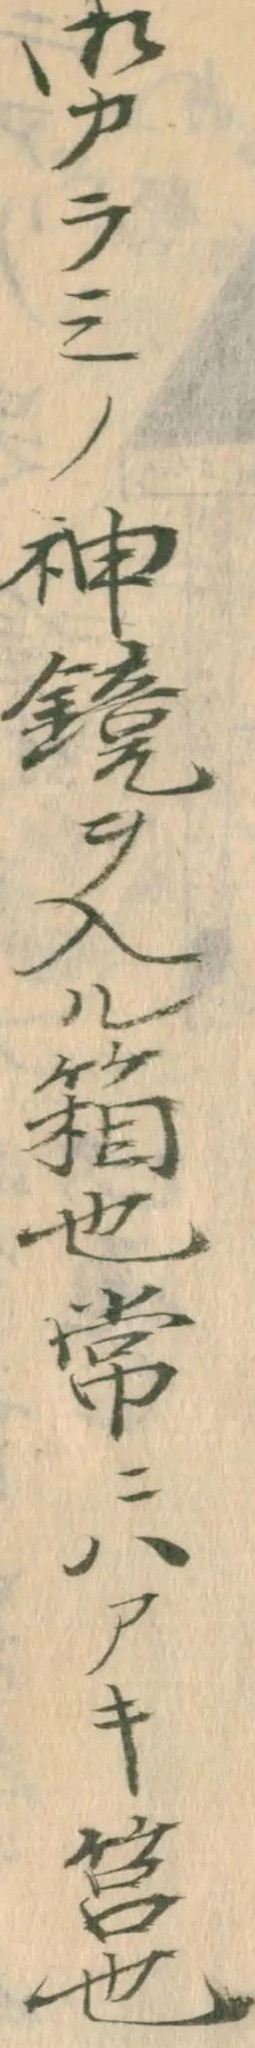御カラミノ神鏡ヲ入ル箱也常ニハアキ筥也
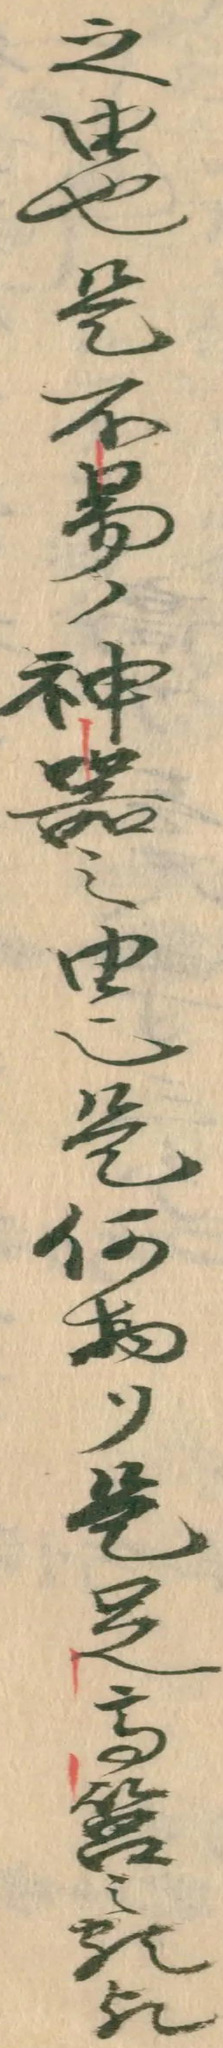之由也是不-易ノ神-器之由也是何物ソ是足_高_筥之類歟
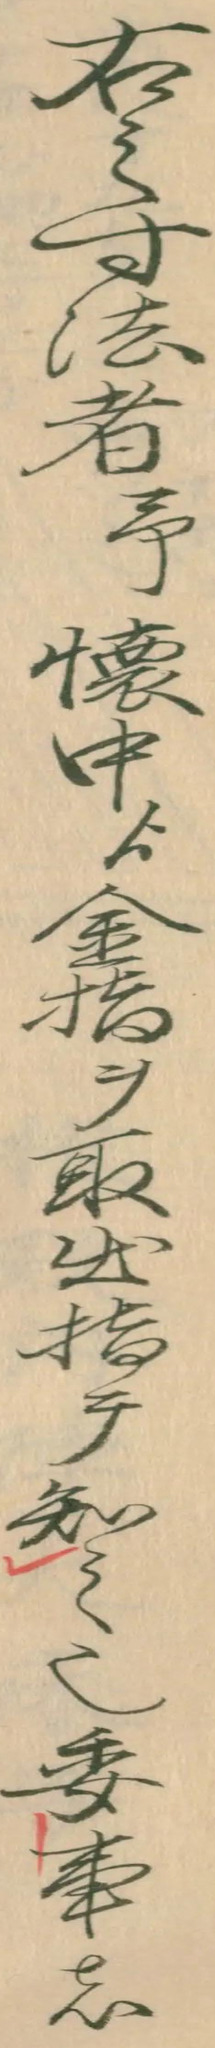右之寸法者予懐中ゟ金指ヲ取出指テ知之也委_事者
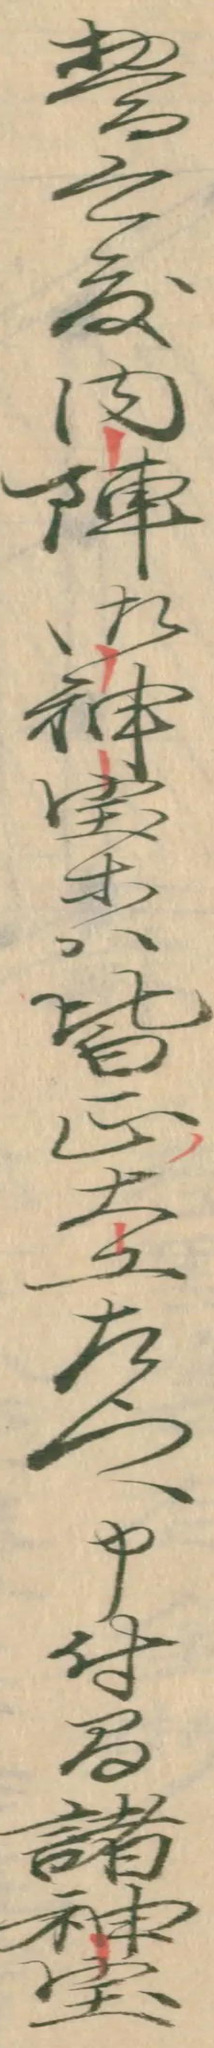惣而今度内-陣御-神-宝等ハ皆正大-工左衛門へ申付間諸神-宝
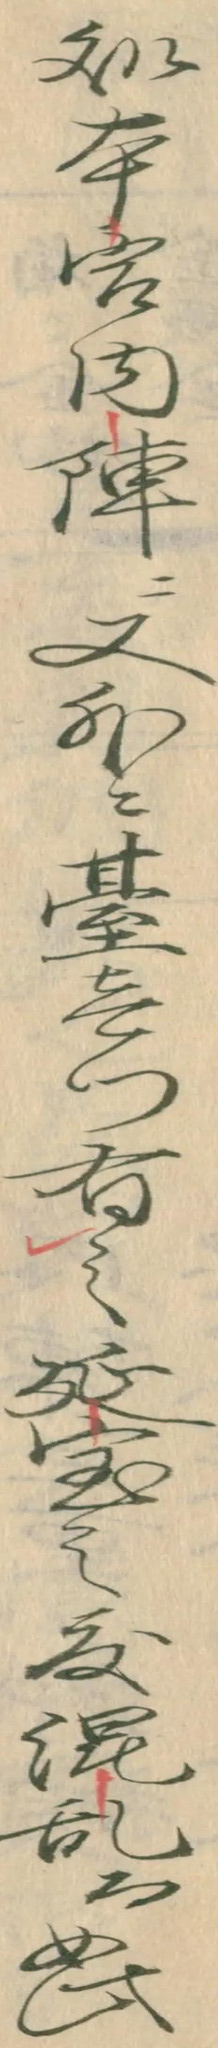処本-宮内-陣ニ又外ニ台壱ツ有之延-宝之度混-乱而如此
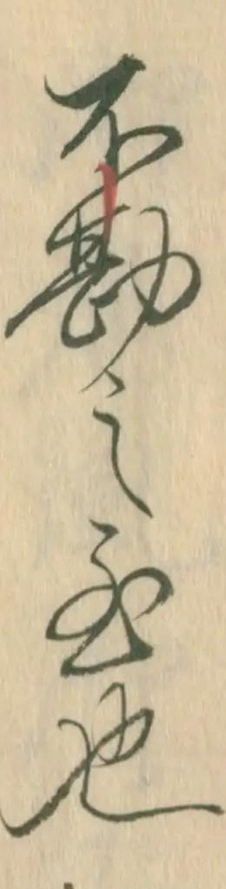不-勘之至也

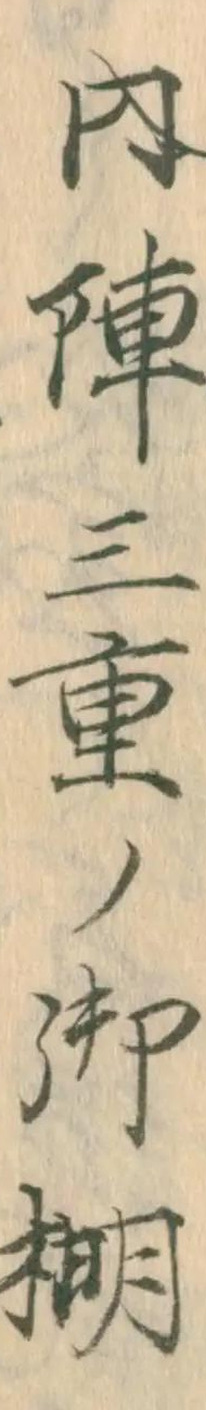内陣三重ノ御棚
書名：賀茂社記録. 第15冊
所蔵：国立国会図書館 National Diet Library, JAPAN
